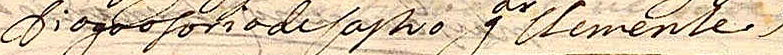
Diogo osorio de Castro gar CLemente
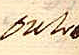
outro
